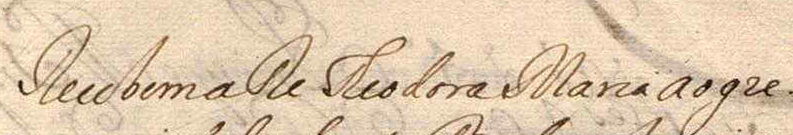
Recebem a Re Theodora Maria ao gre
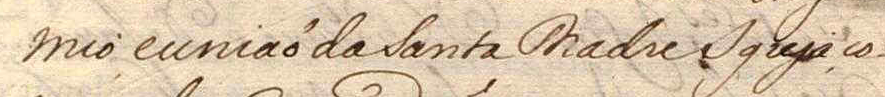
mio, e uniaõ da Santa Madre Igreja, co
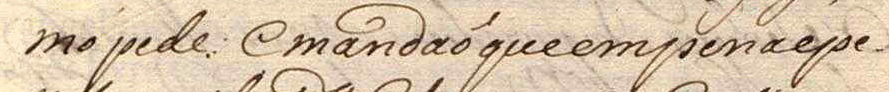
mo pede: E mandaõ que em pena e pe
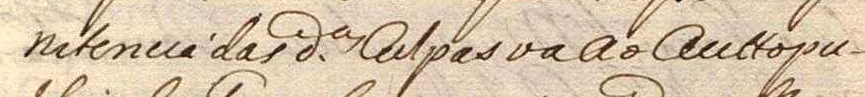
nitencia das d.as Culpas va ao Autto pu
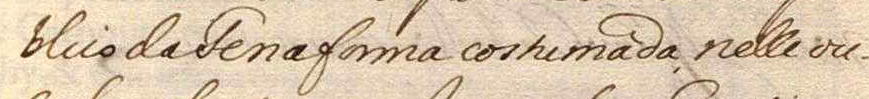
blico da Fe na forma costumada, nelle ou
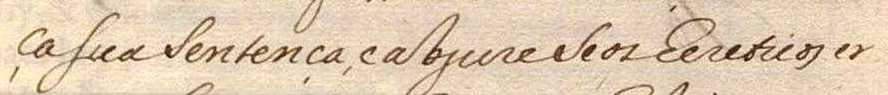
ça sua Sentença, e abjure seos hereticos er
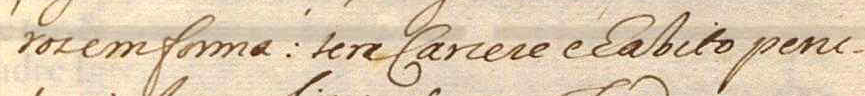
roz em forma: tera Carcere e habito peni
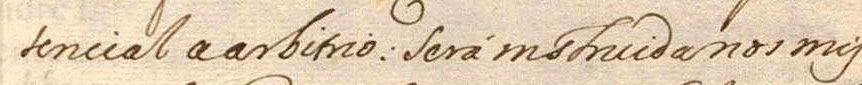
tencial a arbitrio: será instruida nos mis
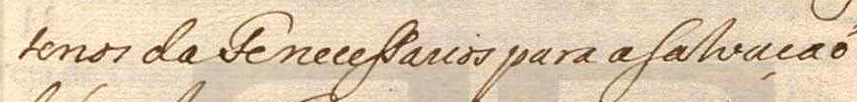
terios da Fe necessarios para a salvaçaõ
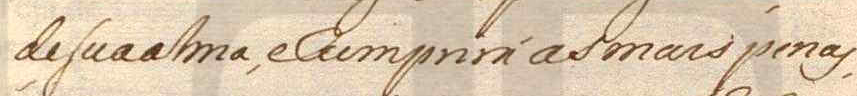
de sua alma, e Cumprirá as mais penas,
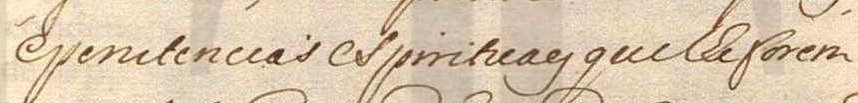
e penitencias espirituaes que lhe forem
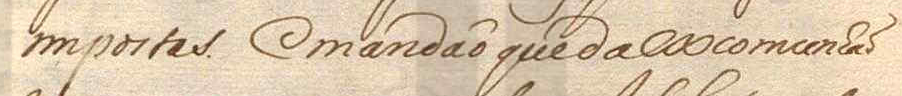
impostas. E mandaõ que da excomunhaõ
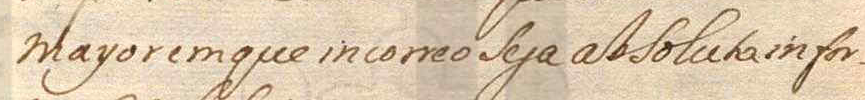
mayor em que incorreo seja absoluta infor
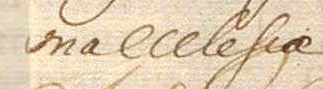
ma ecclessiæ
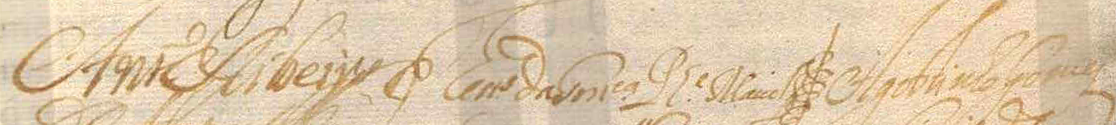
Anto Ribeiro Theu.s da Fonca Ph.e Maciel Agostinho Gomes
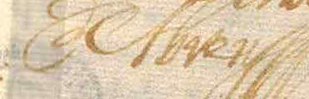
dAbreu
